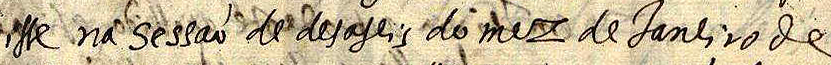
disse na sessaõ de desaseis do mez de Janeiro de
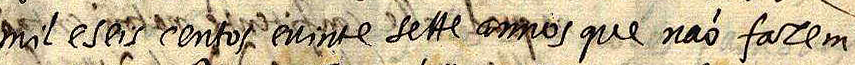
mil e seiscentos e uinte sette annos que naõ fazem
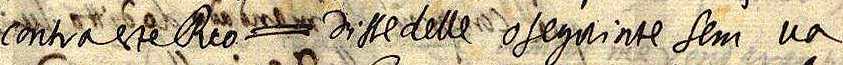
contra este Reo = disse delle o seguinte sem ua
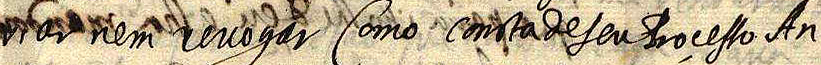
riar nem reuogar Como consta de seu Processo An
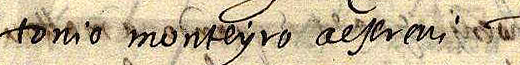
tonio monteyro o escreui
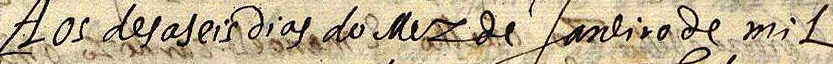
Aos desaseis dias do Mez de Janeiro de miL
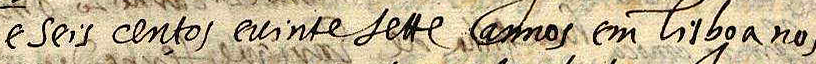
e Seiscentos e uinte sette annos em lisboa nos
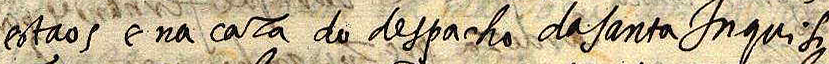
estaos e na caza do despacho da santa Jnquisi
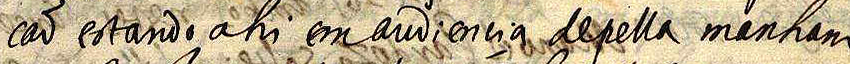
ção estando ahi em audiençia de pella manham
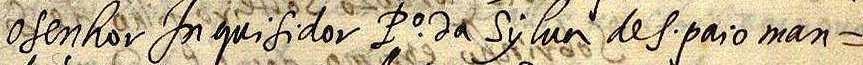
o senhor Jnquisidor Po. da Sylua de s. paio man
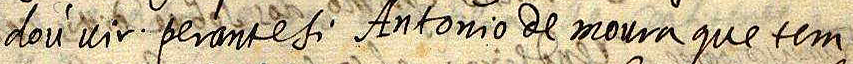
dou uir perante si Antonio de moura que tem
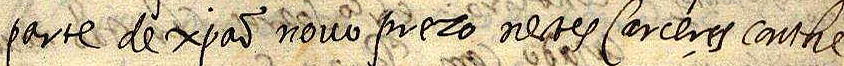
parte de xpaõ nouo prezo nestes Carceres conthe
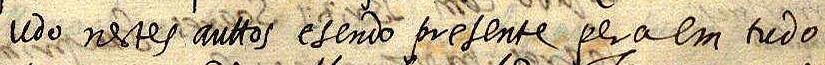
udo nestes auttos e sendo presente pera em tudo
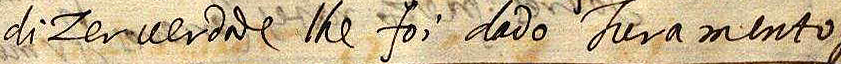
dizer uerdade lhe foi dado Juramento.
